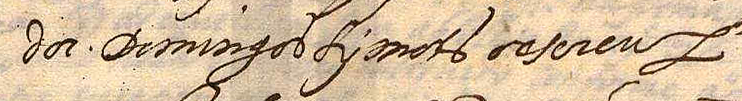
dor. Domingos Symois o escreuy
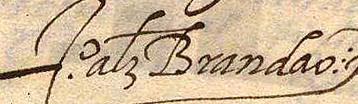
J.o al̄z Brandaõ.
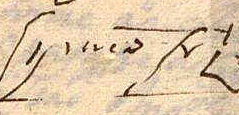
Sijmaõ frz̄
